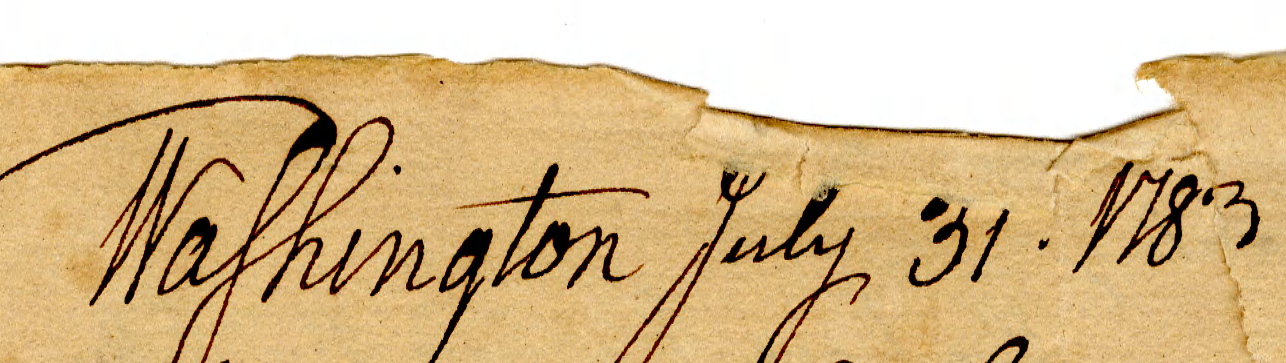Washington July 31. 1783
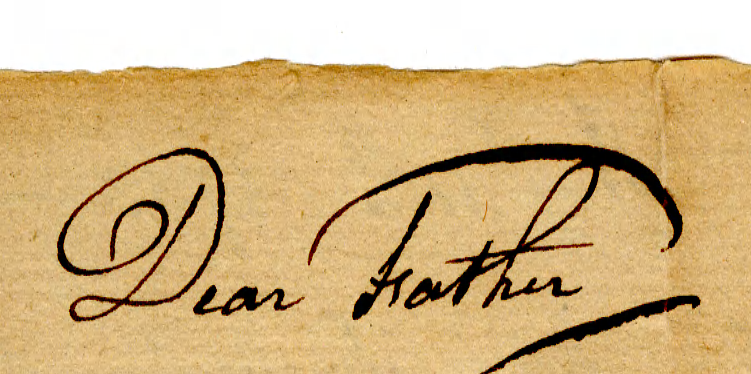Dear Father
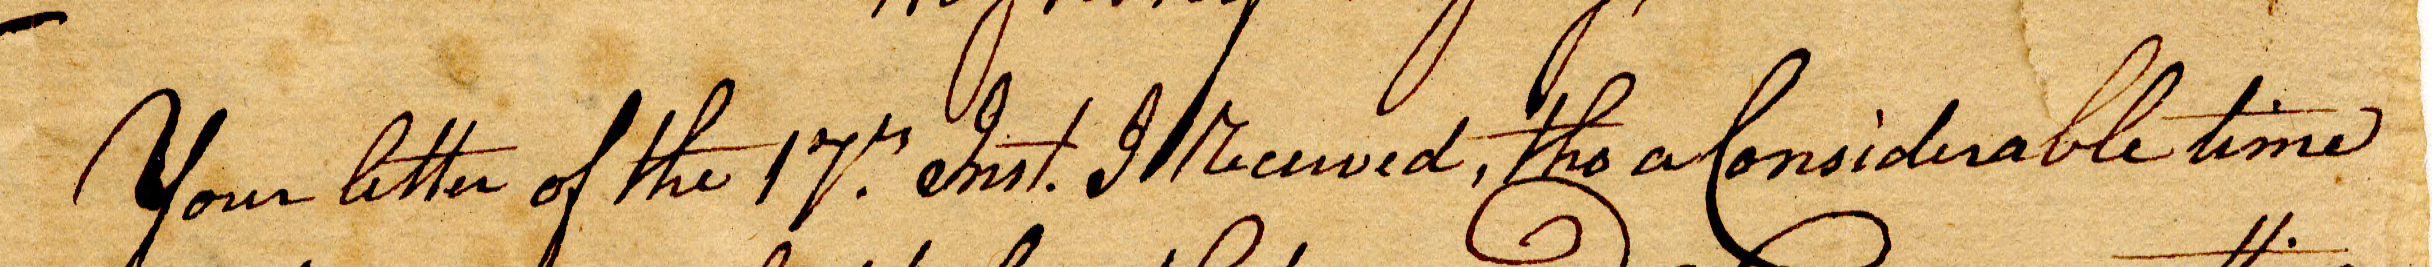Your letter of the 17^th. Inst. I received, tho a Considerable time
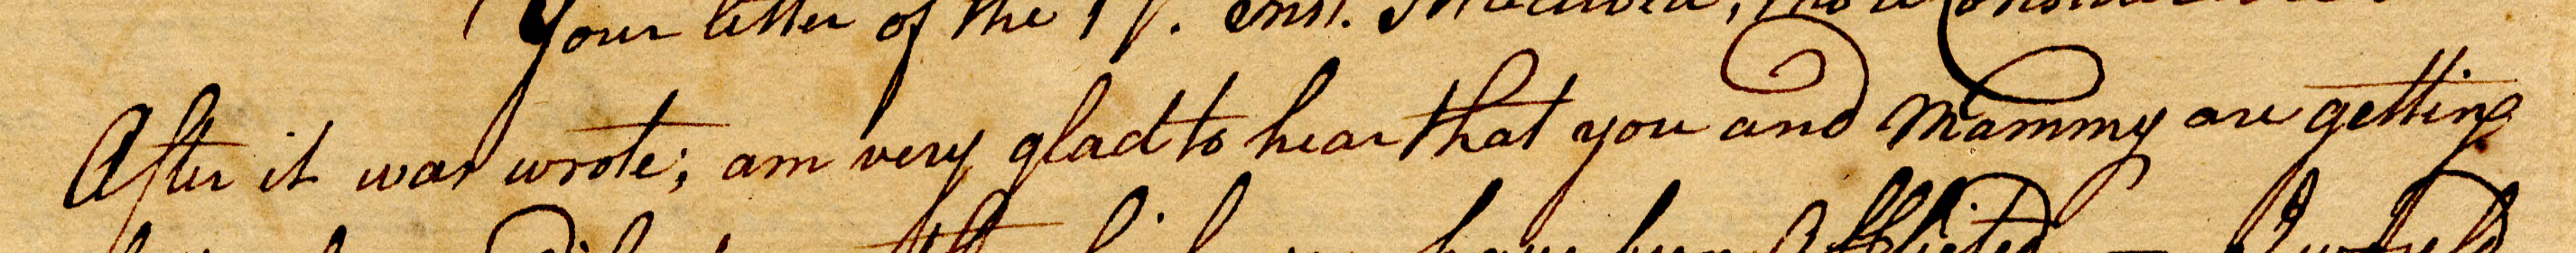After it was wrote; am very glad to hear that you and Mammy are getting
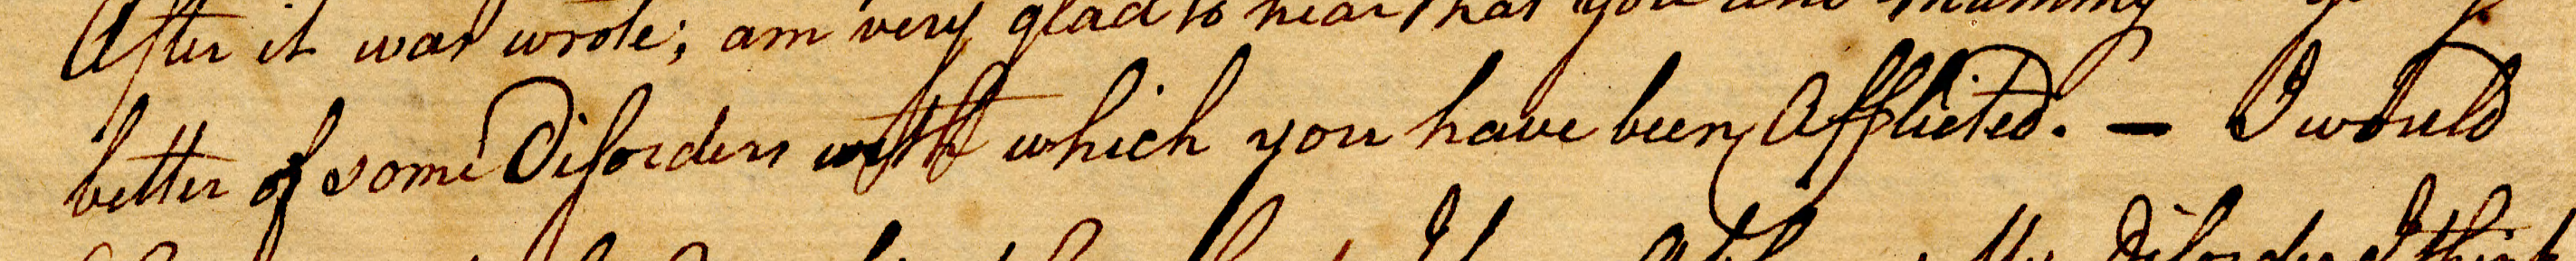better of some disorder with which you have been afflicted.- I would
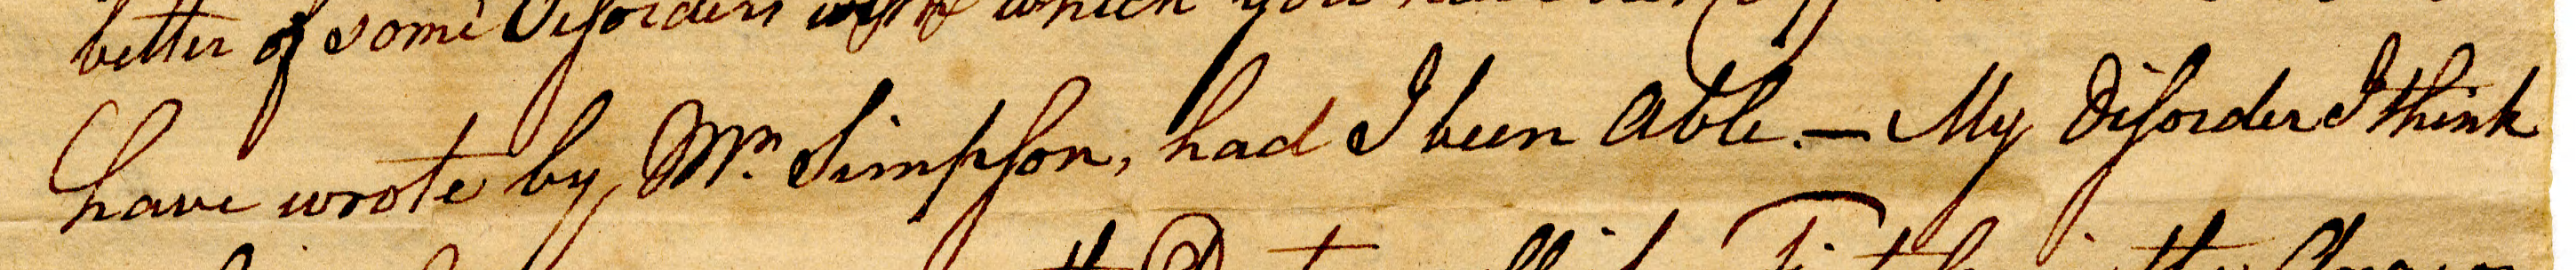have wrote by M^r. Simpson, had I been able.- My disorder I think
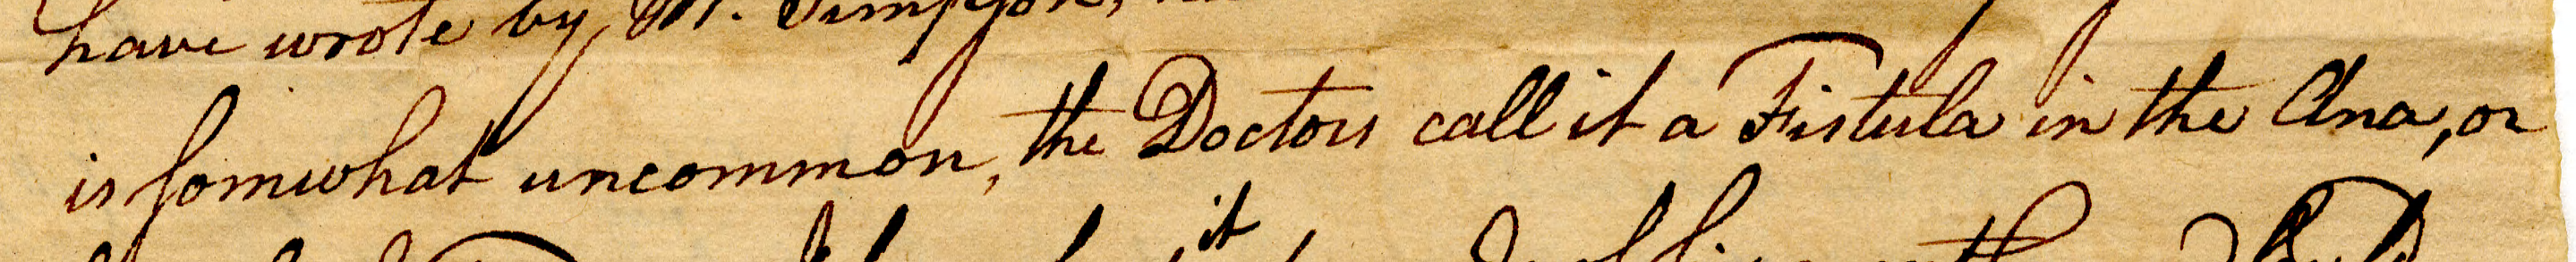is somewhat uncommon, the Doctors call it a Fistula in the Ana, or
